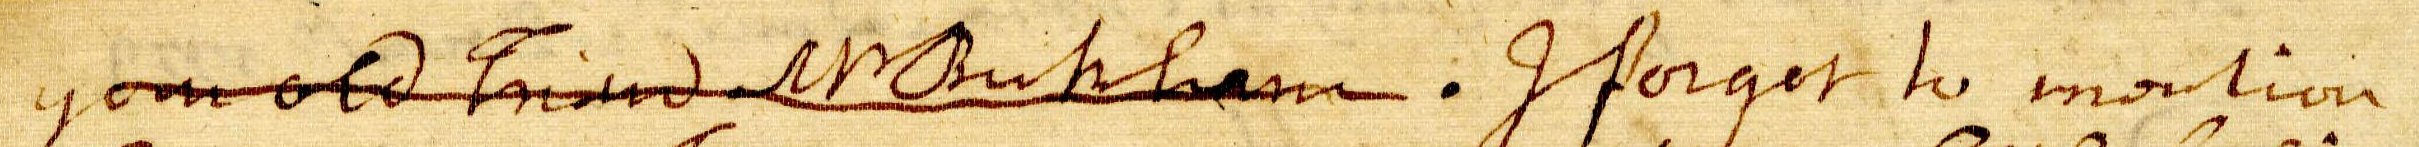[your old Friend M^r Bickham.] I forgot to mention
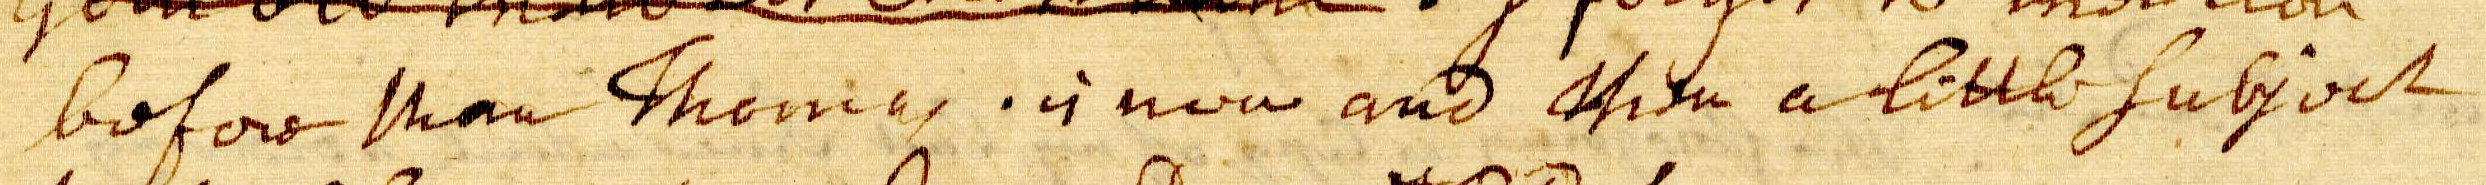before then Thomas is now and then a little subject
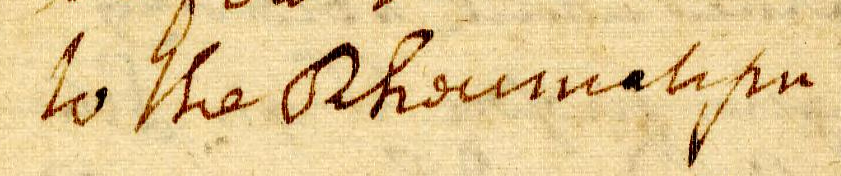to the Rheumatism
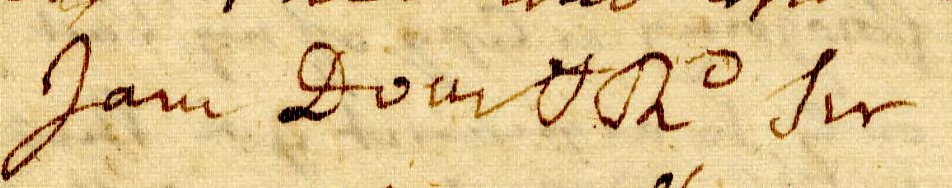I am Dear & R^d Sir
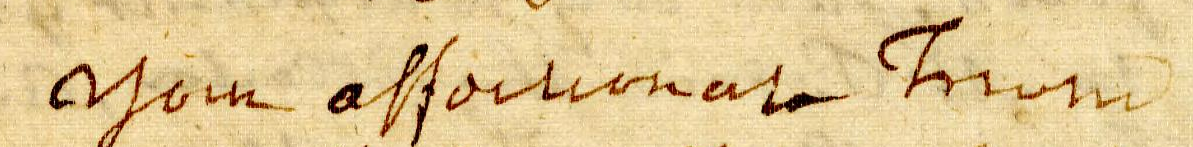Your affectionate Friend
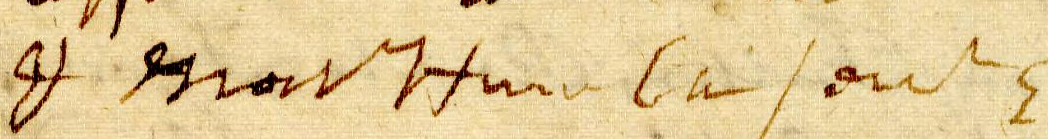& Most Humble Serv^t E
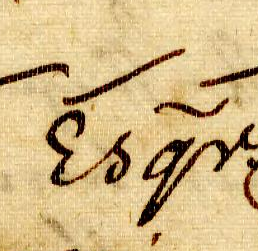Esq^r
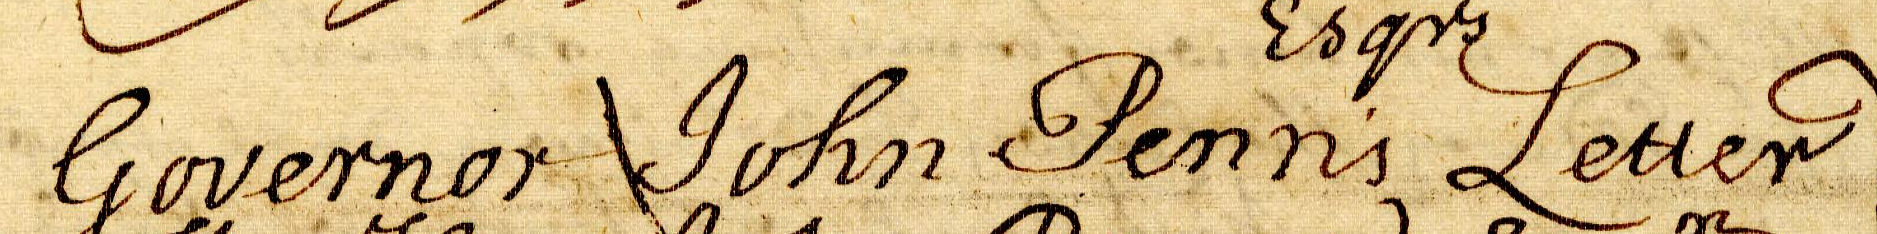Governor John Penn's Letter
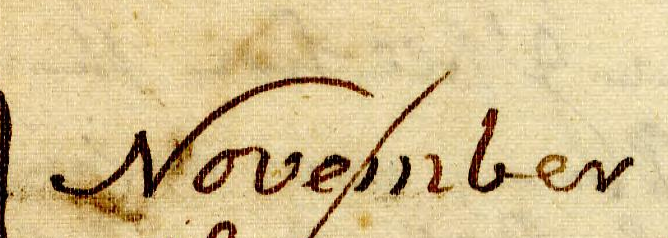November
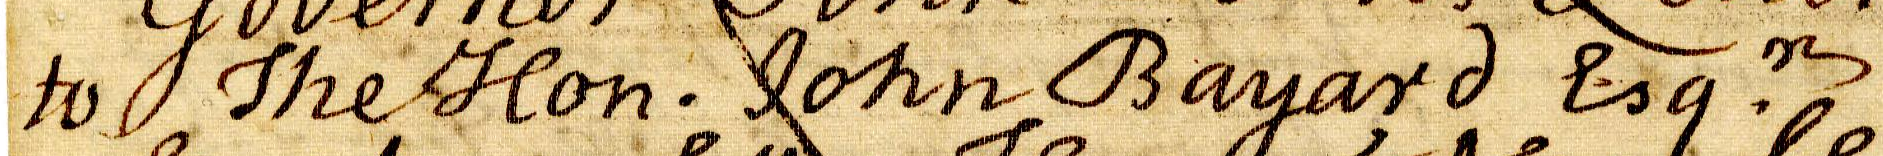to The Hon. John Bayard Esq^r.
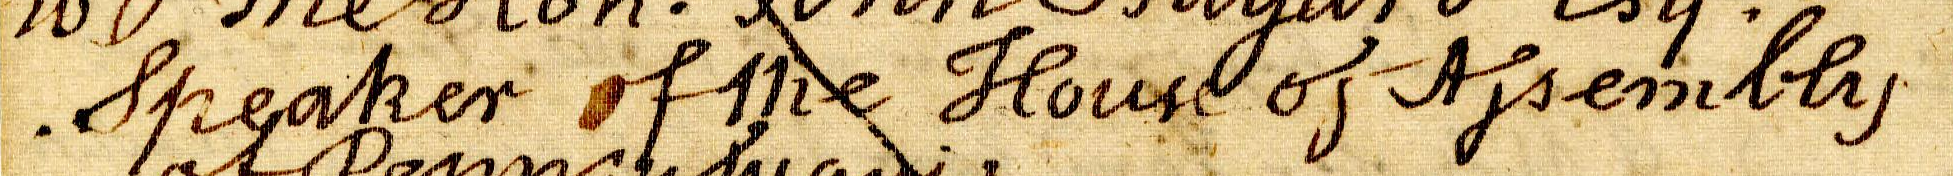Speaker of the House of Assembly
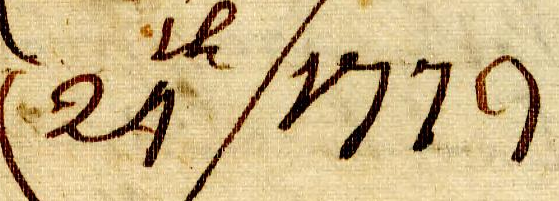24^th 1779
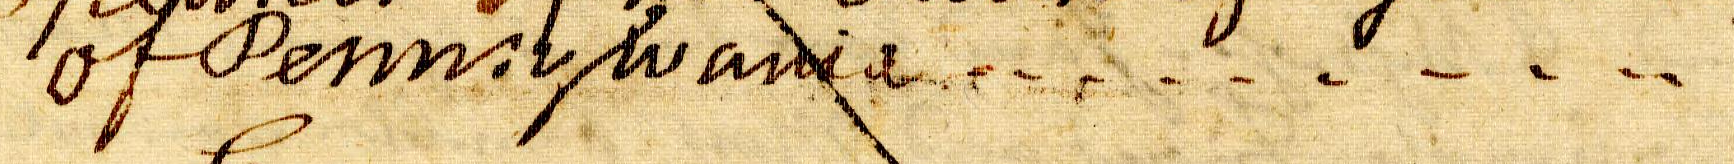of Pennsylvania---------
